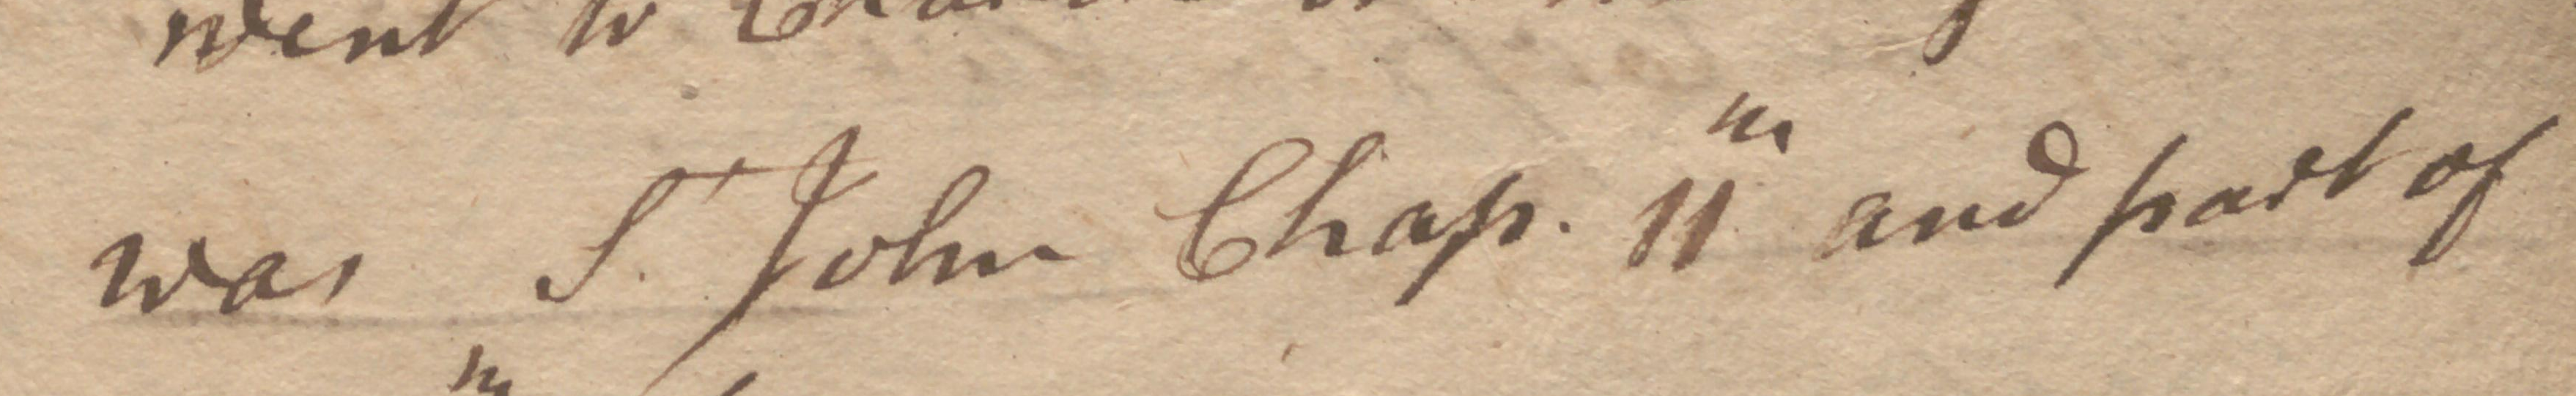was S^t. John Chap. 11^th and part of
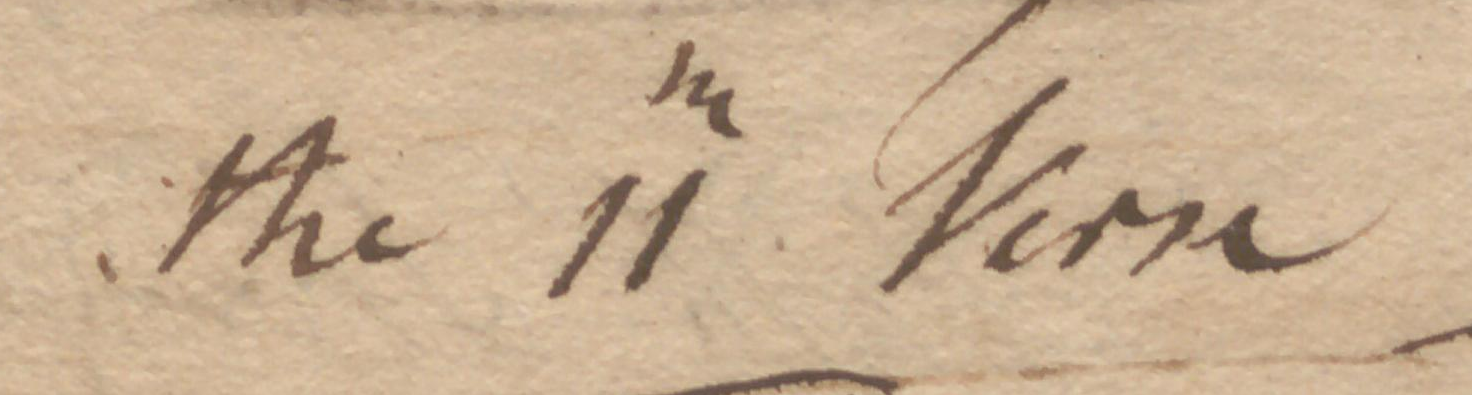the 11^th Verse
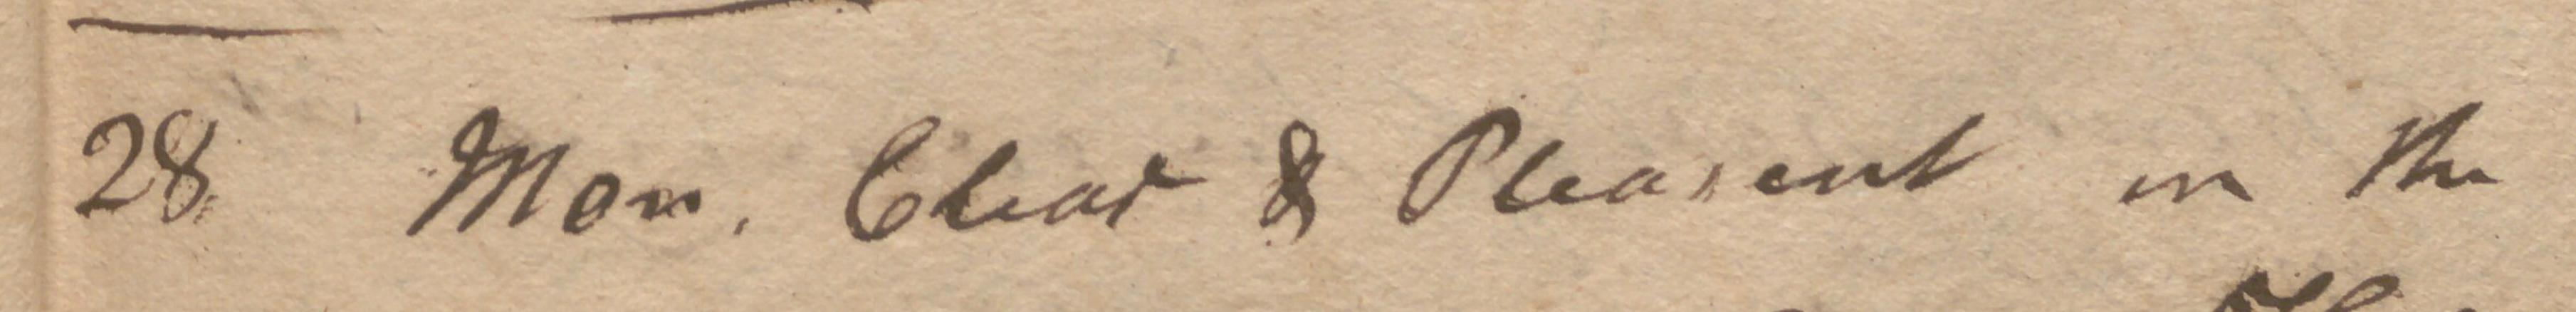28 Mon. Clear & Pleasent in the
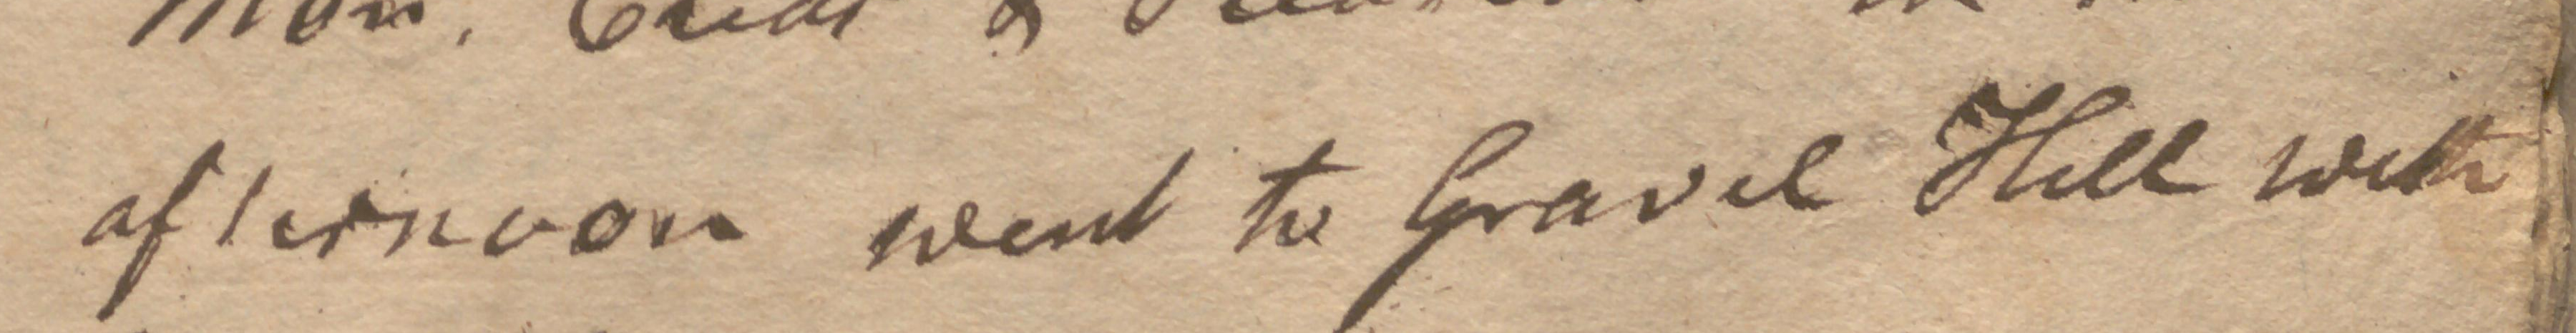afternoon went to Gravel Hill with
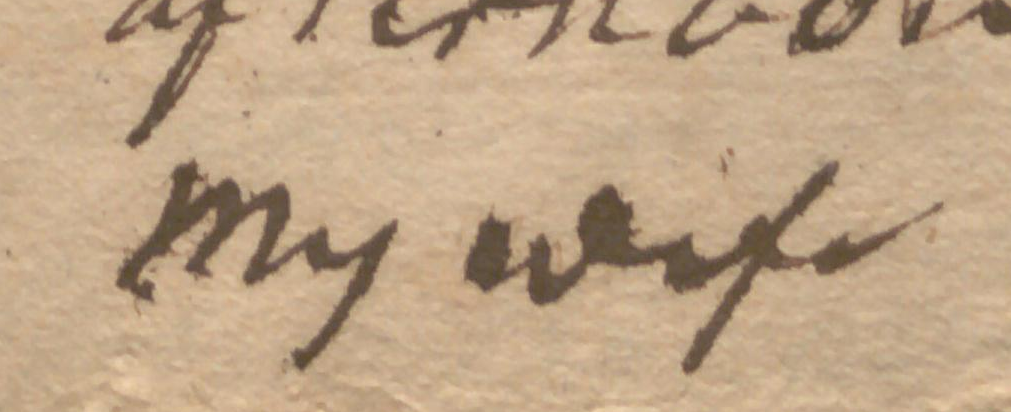My wife
